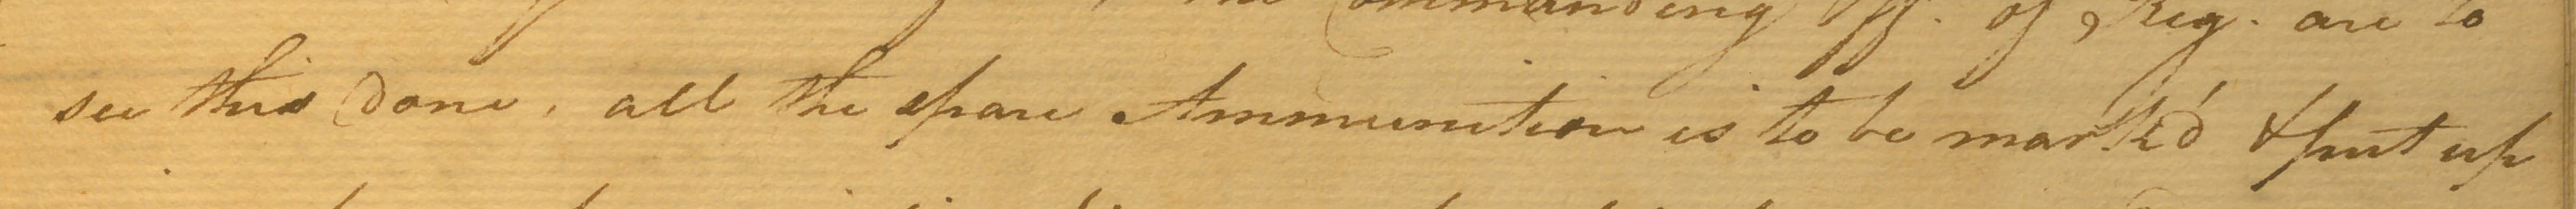see this done. all the spare Ammunition is to be mark'd & put up
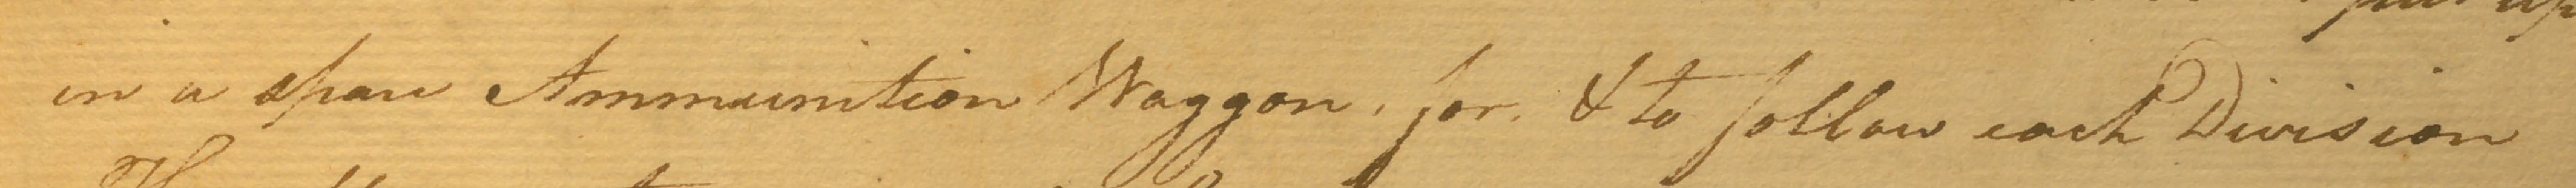in a spare Ammunition Waggon for & to follow each Division
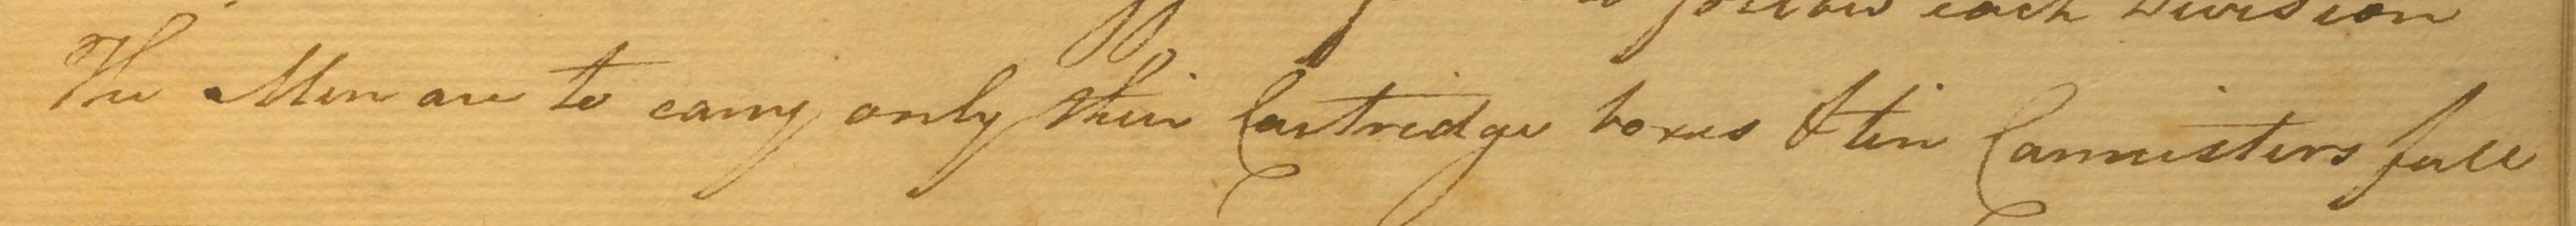The Men are to carry only their Cartridge boxes & tin Cannisters full
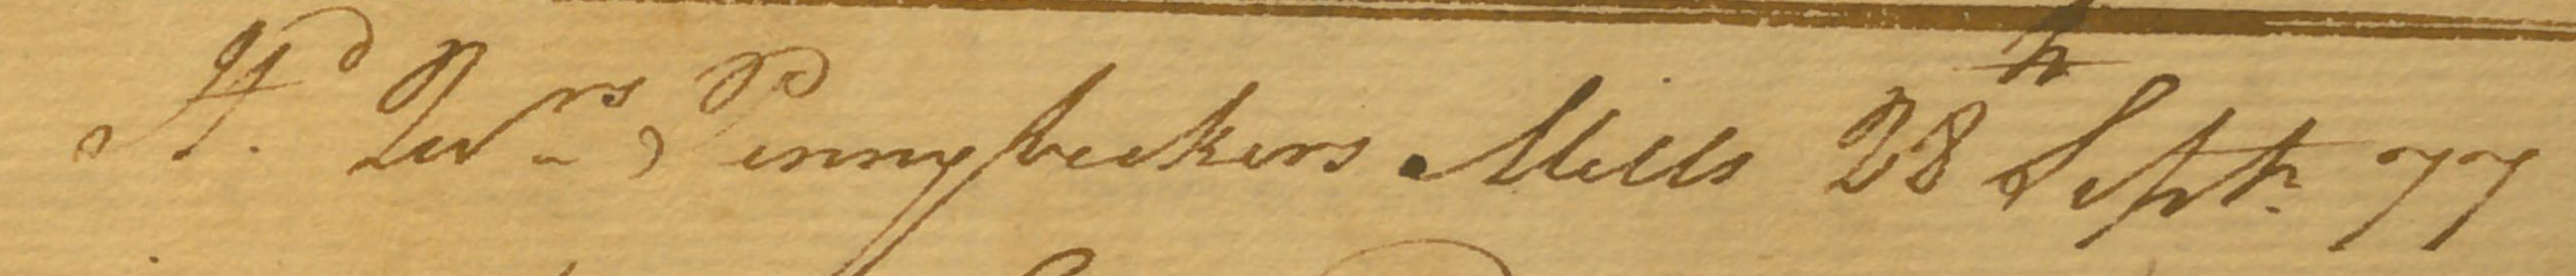H^d. Qu^rs Pennypackers Mills 28^th Sept^r. 77
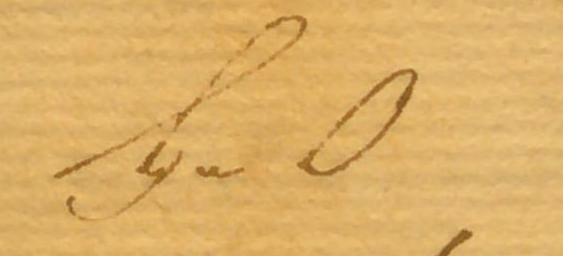G.O
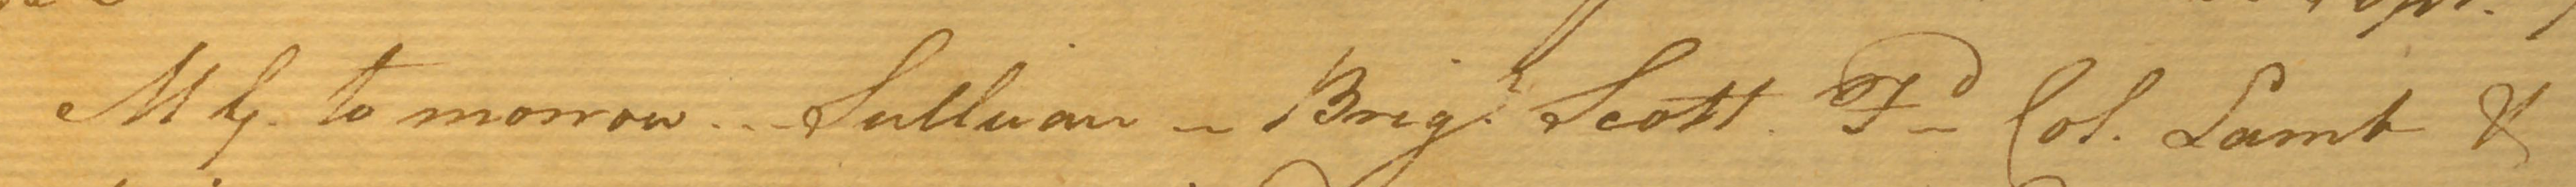MG. to morrow.. Sullivan- Brig^r Scott F^d Col. Lamb &
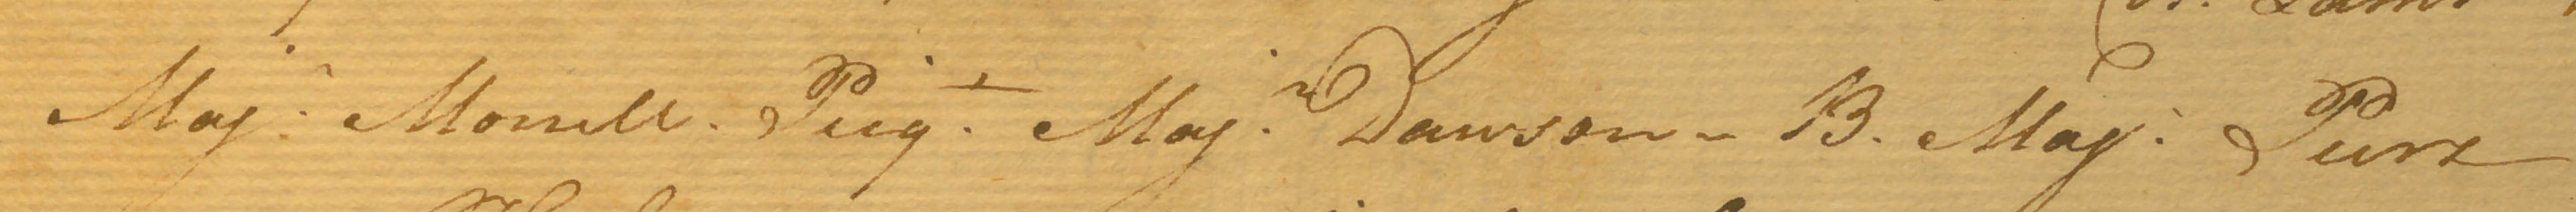Maj^r. Morell Picq^t. Maj^r. Dawson- B. Maj: Pure
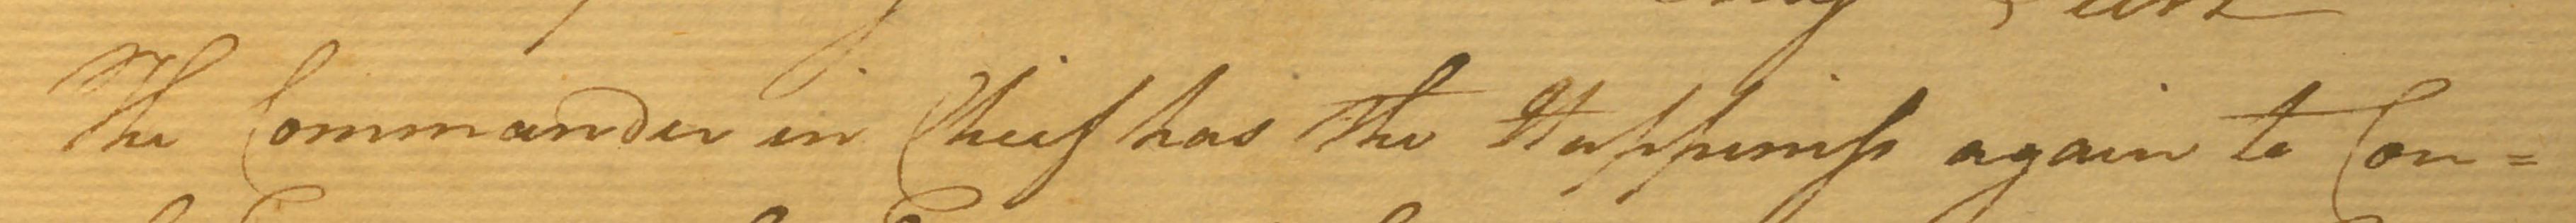The Commander in Chief has this Happiness again to Con-
